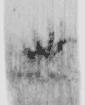卅
